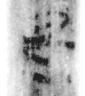是
